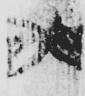門
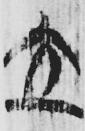立
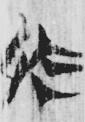於
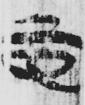𠁩
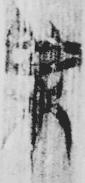傑（桀）
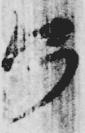乃
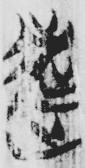逃
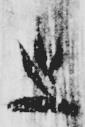之
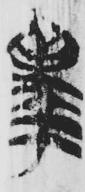鬲
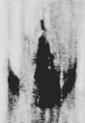山
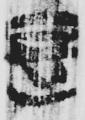是（氏）
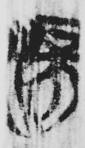湯
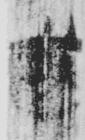或（又）
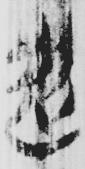從
